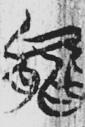能
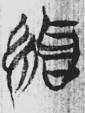○（治）
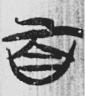百
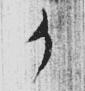人
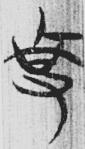史（使）
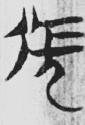倀（長）
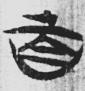百
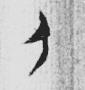人
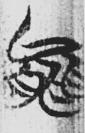能
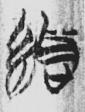○（治）
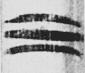三
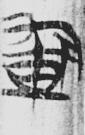軍
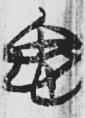思
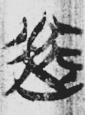○（帥）
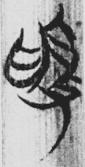受
